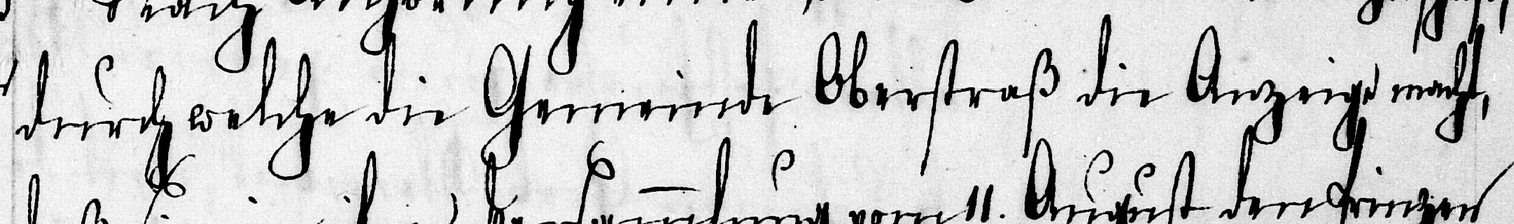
durch welche die Gemeinde Oberstraß die Anzeige mach¬
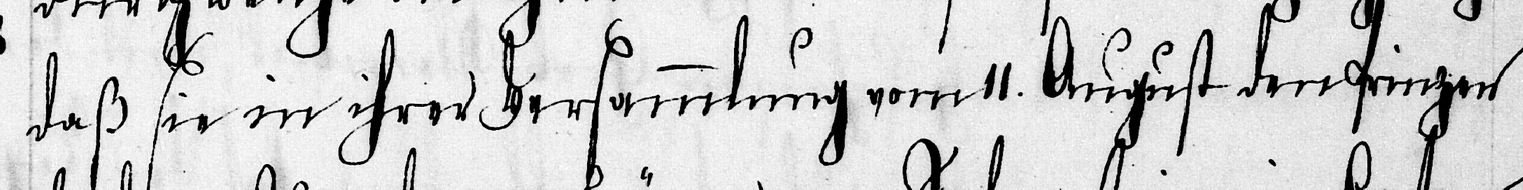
daß sie in ihrer Versammlung vom 11. August den Prinzen
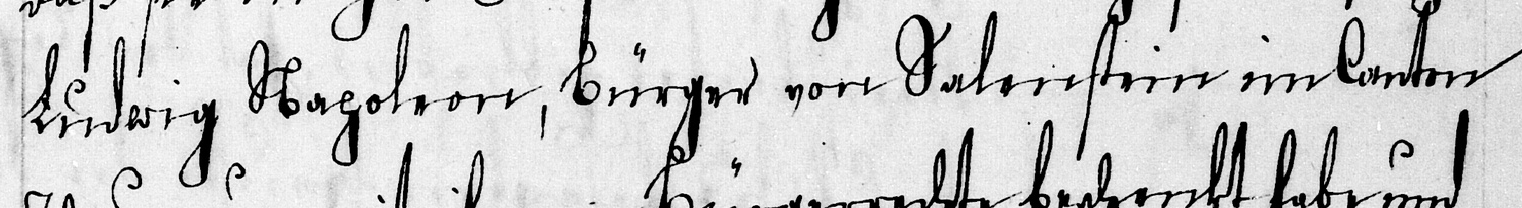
Ludwig Napoleon, Bürger von Salenstein im Canton
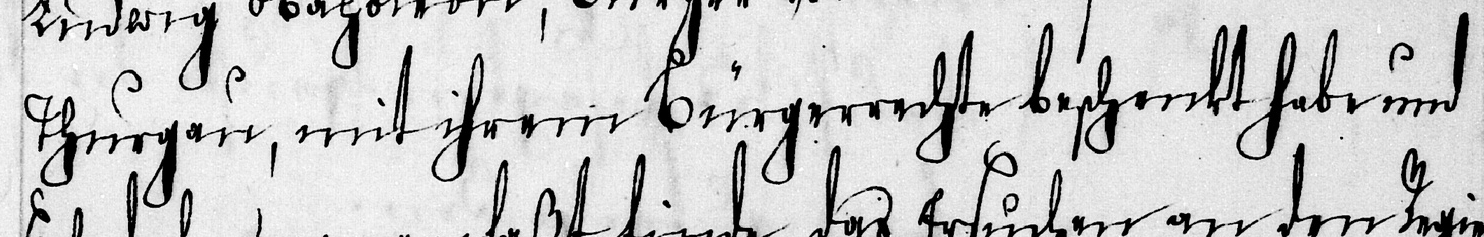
Thurgau, mit ihrem Bürgerrechte beschenkt habe und
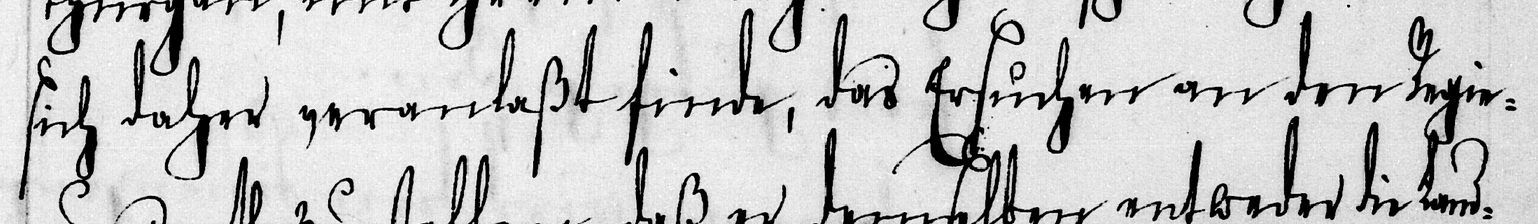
sich daher veranlaßt finde, das Ersuchen an den Regie¬
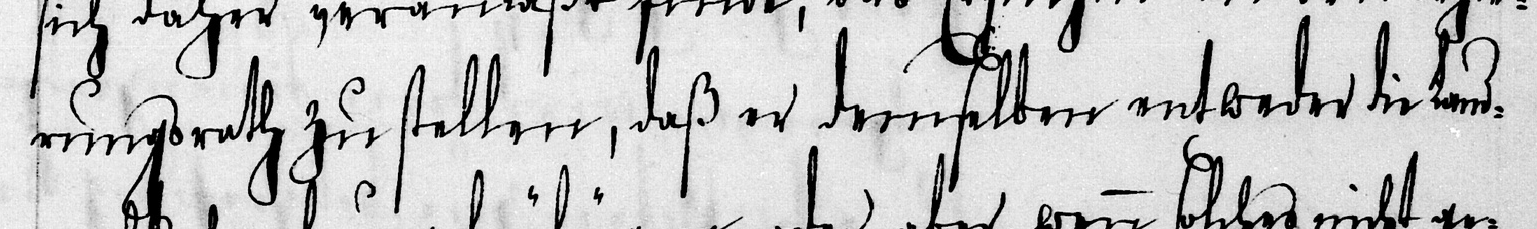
rungsrath zu stellen, daß er demselben entweder die Lan¬
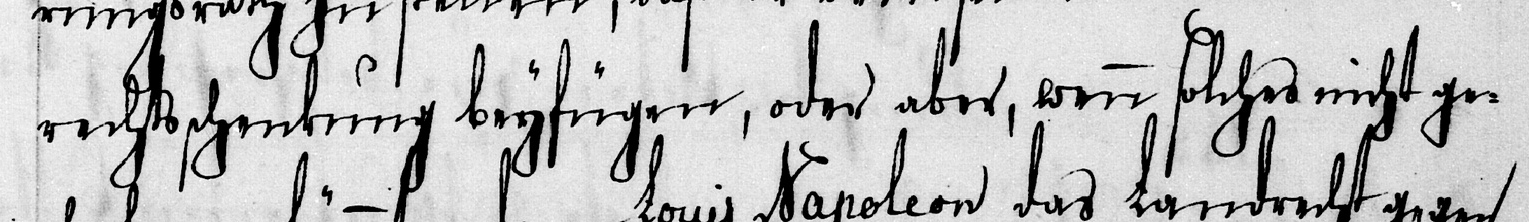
rechtsschenkung beyfügen, oder aber, wenn solches nicht g¬
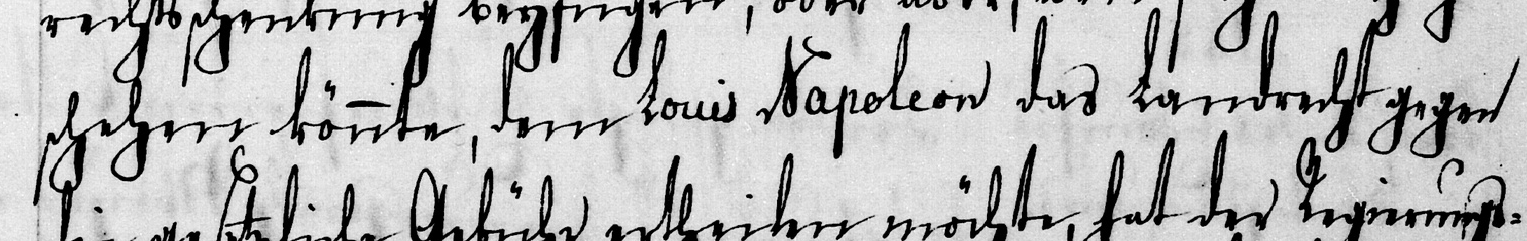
eschehen könnte, dem Louis Napoleon das Landrecht gegen
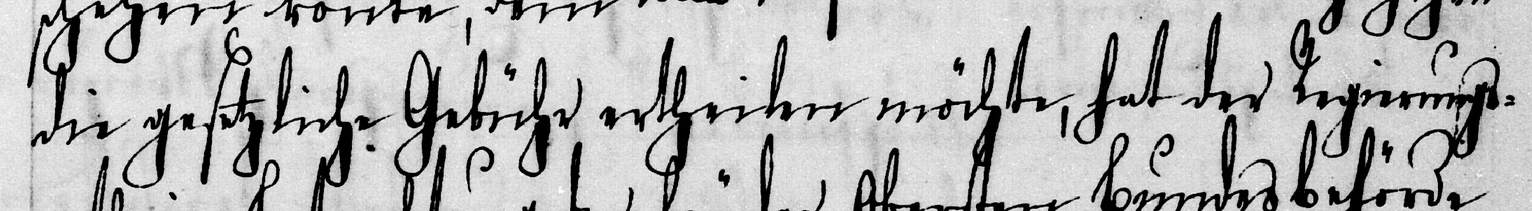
die gesetzliche Gebühr ertheilen möchte, hat der Regierung¬
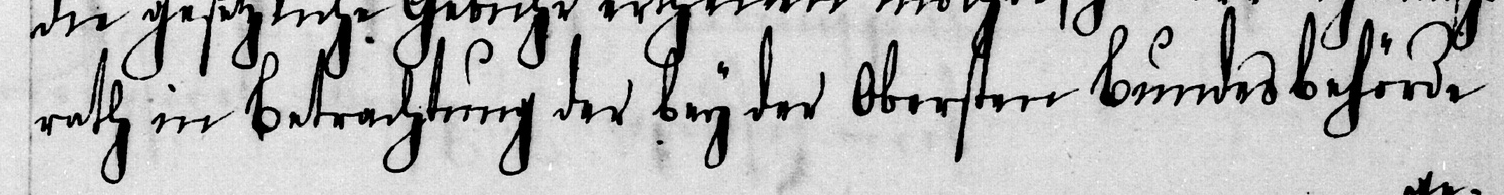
srath in Betrachtung der bey der Obersten Bundesbehörde
